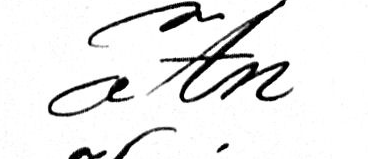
An
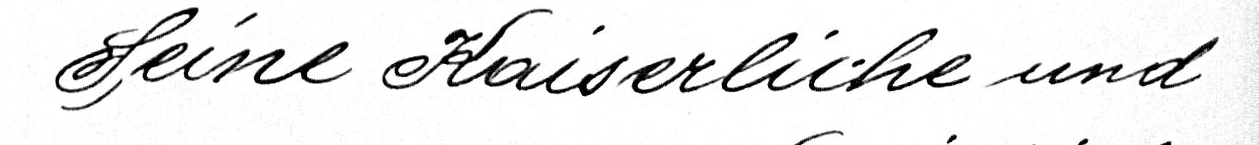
Seine Kaiserliche und
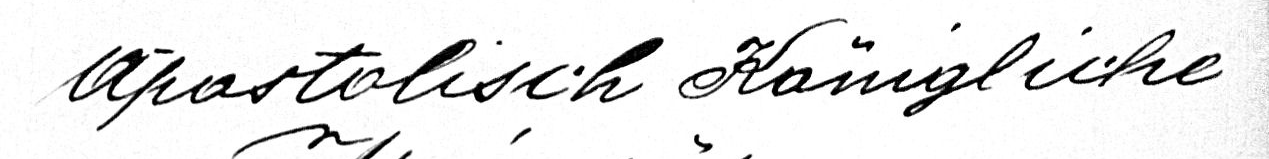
Apostolisch Königliche
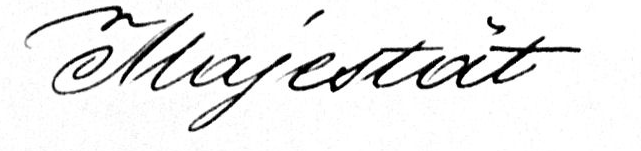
Majestät
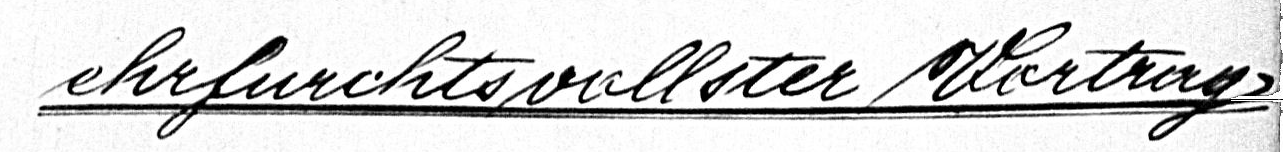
ehrfurchtsvollster Vortrag
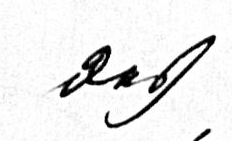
des
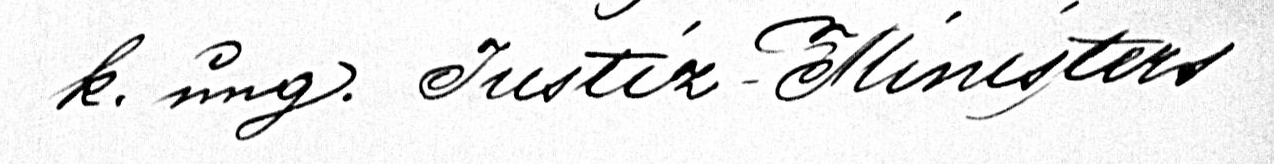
k. ung. Justiz - Ministers
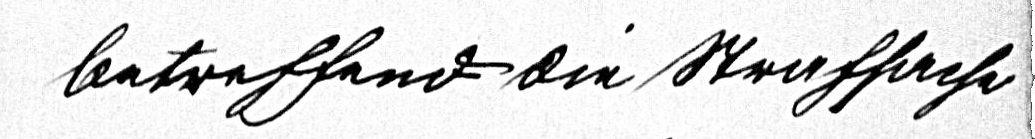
betreffend die Strafsache
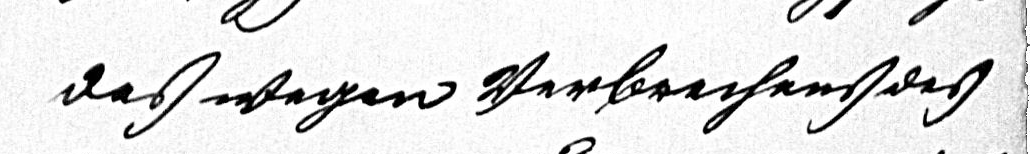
des wegen Verbrechens des
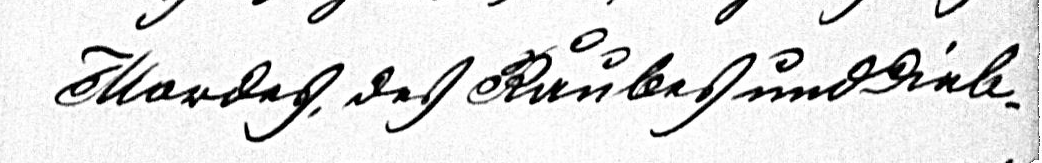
Mordes, des Raubes und Dieb¬
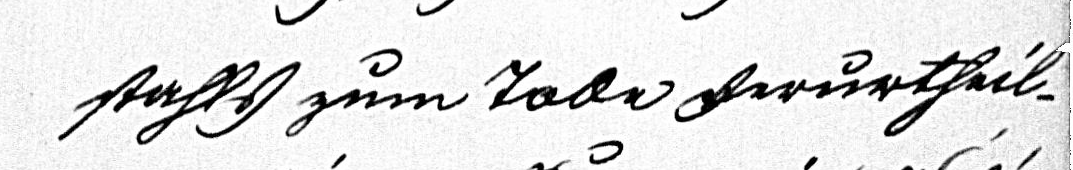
strahls zum Tode verurtheil¬
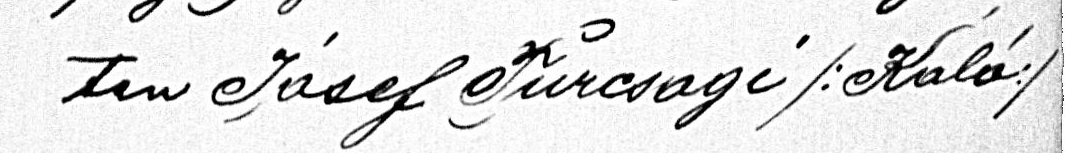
ten Jósef Turcsogi /: Káló:/
